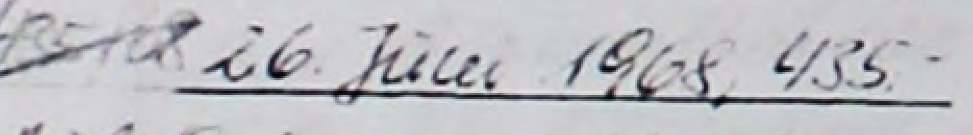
435/68 26. Juni 1968, 435.-
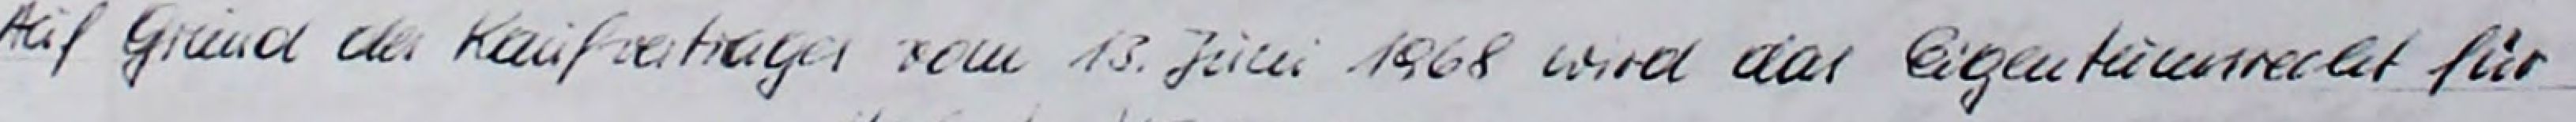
Auf Grund des Kaufvertrages vom 13. Juni 1968 wird das Eigentumsrecht für
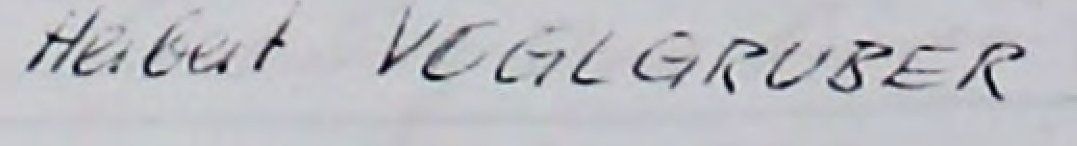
Herbert VEGLGRUBER
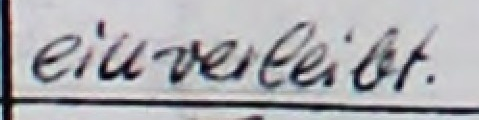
einverleibt.
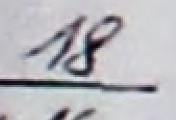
18
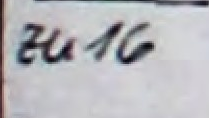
zu 16
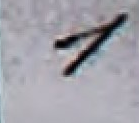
1
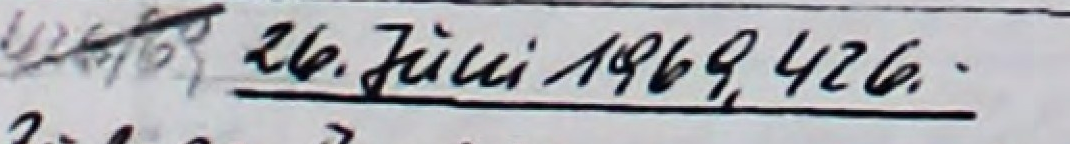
426/69 26. Juni 1969, 426.-
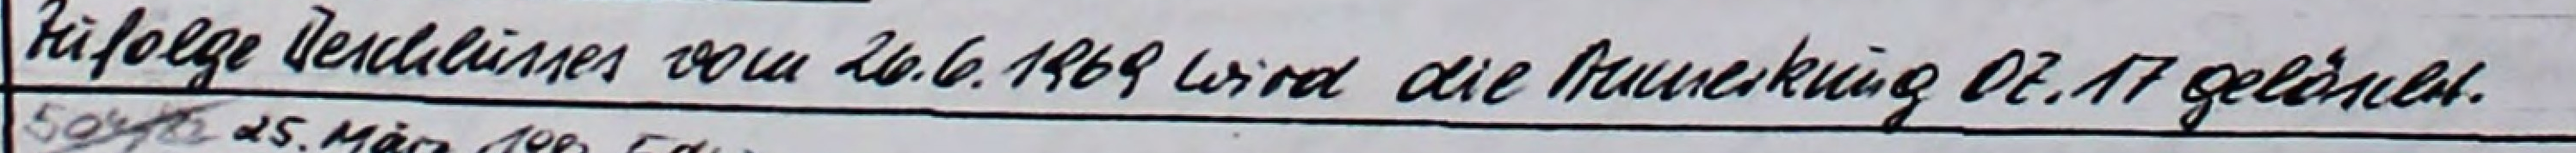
Zufolge Beschlusses vom 26.6.1969 wird die Anmerkung 07.17 gelöscht.
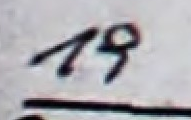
19
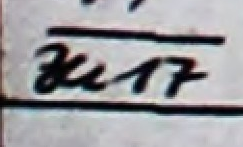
zu 17
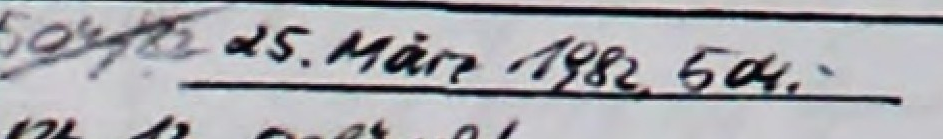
504/82 25. März 1982. 504.-
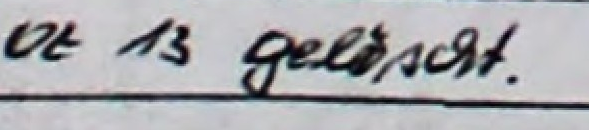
oz 13 gelöscht.
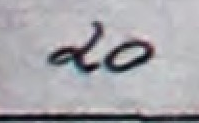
20
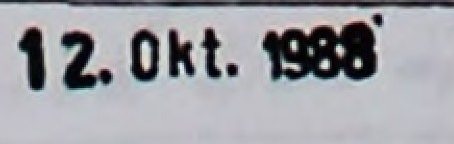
12. Okt. 1988
